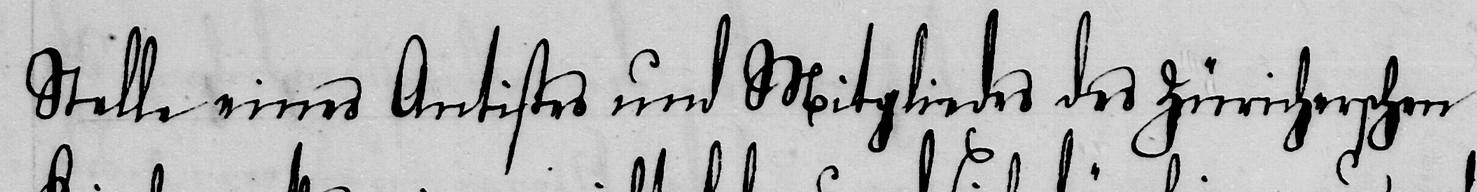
Stelle eines Antistes und Mitgliedes des Zürcherschen
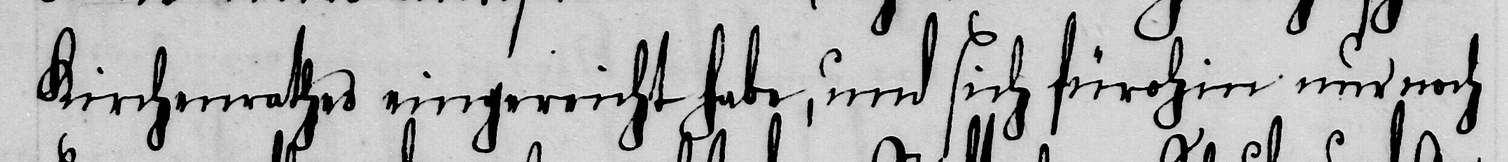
Kirchenrathes eingereicht habe, und sich fürohin nur noch
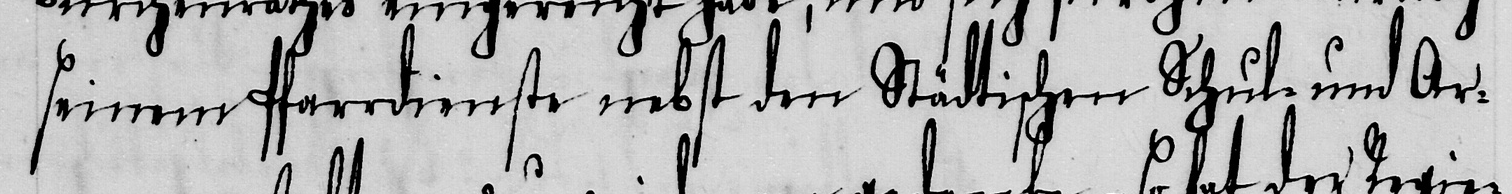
seinem Pfarrdienste nebst den Städtischen Schul- und Ar¬
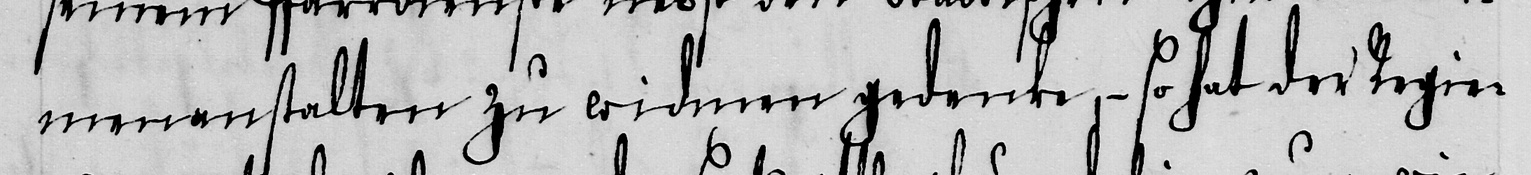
menanstalten zu widmen gedenke, – so hat der Regie¬
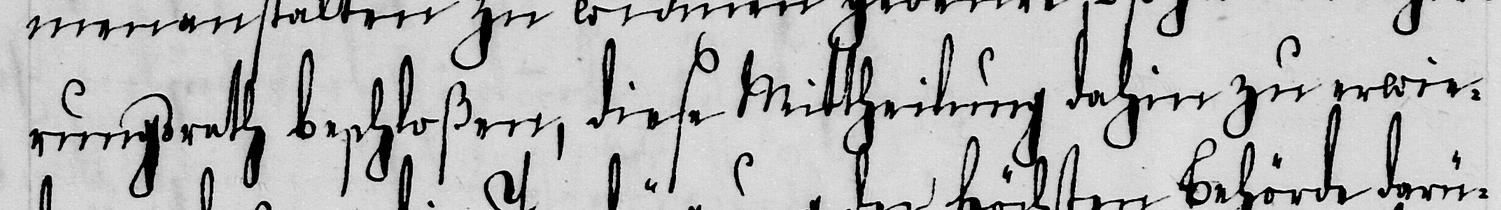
rungsrath beschloßen, diese Mittheilung dahin zu erwie¬
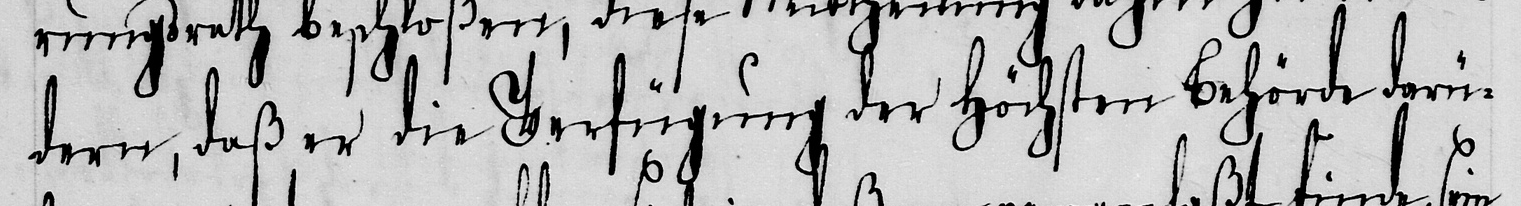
dern, daß er die Verfügung der Höchsten Behörde darü¬
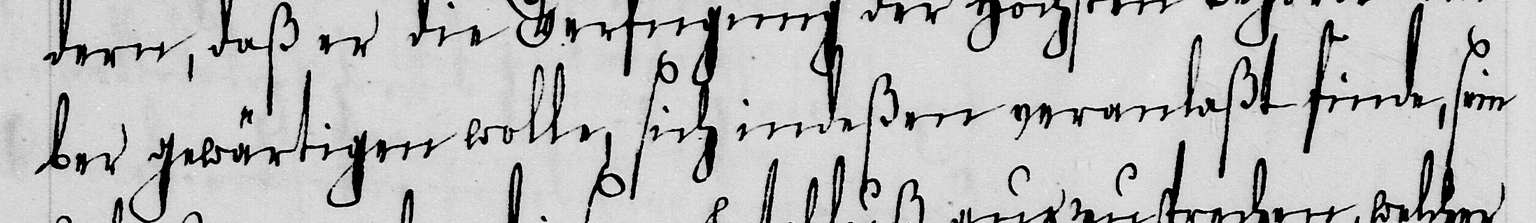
ber gewärtigen wolle, sich indeßen veranlaßt finde, sein
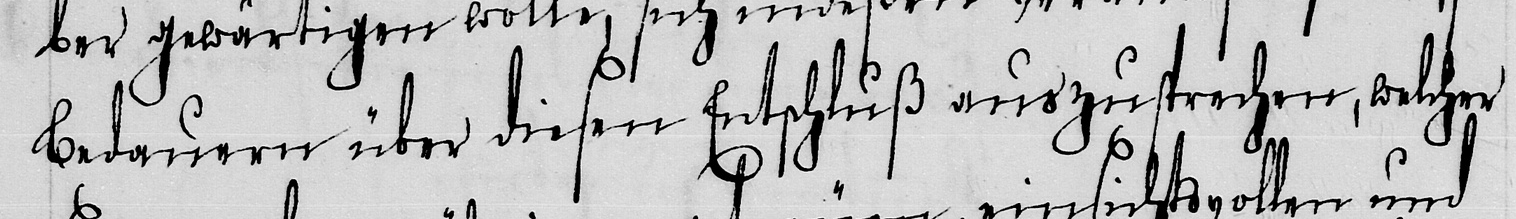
Bedauern über diesen Entschluß auszusprechen, welch¬
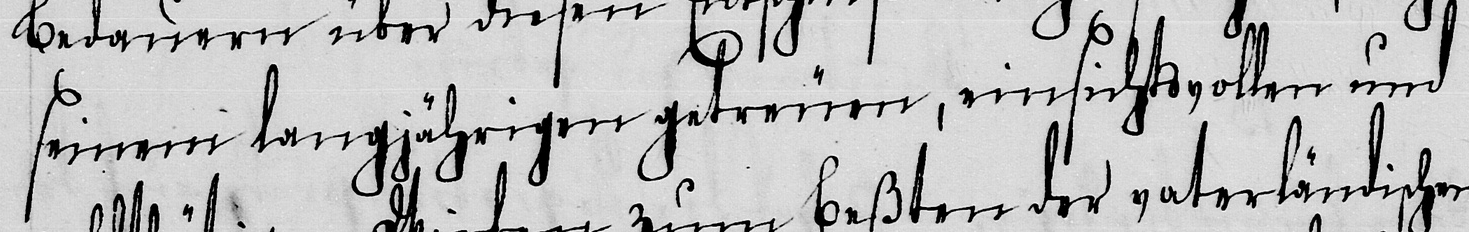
seinem langjährigen getreuen, einsichtsvollen und
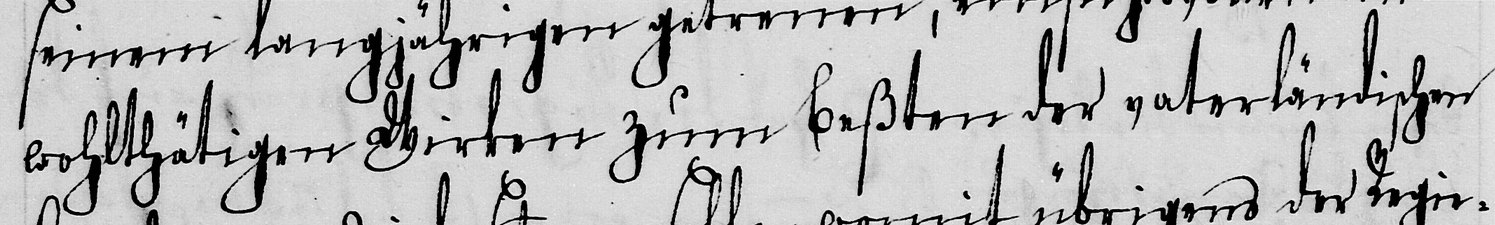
wohlthätigen Wirken zum Beßten der vaterländischen
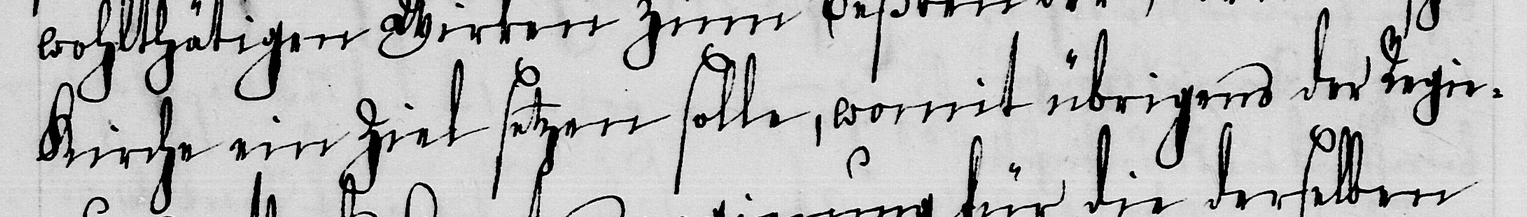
Kirche ein Ziel setzen solle, womit übrigens der Regie¬
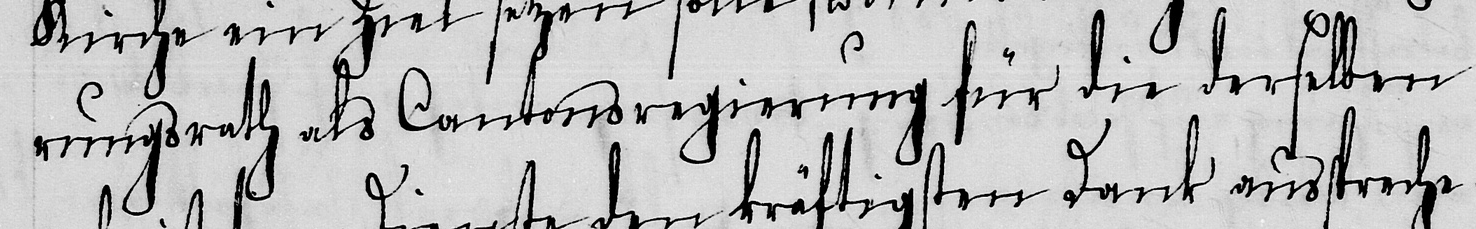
rungsrath als Cantonsregierung für die derselben
